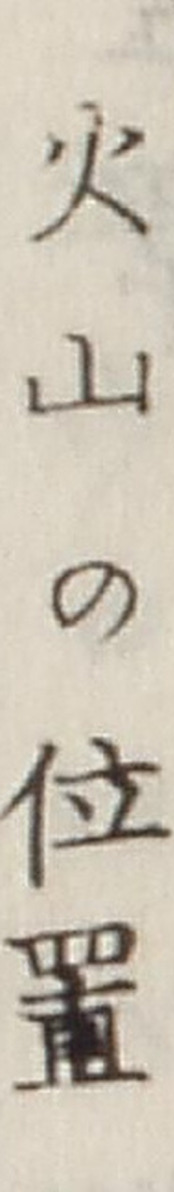火山の位置
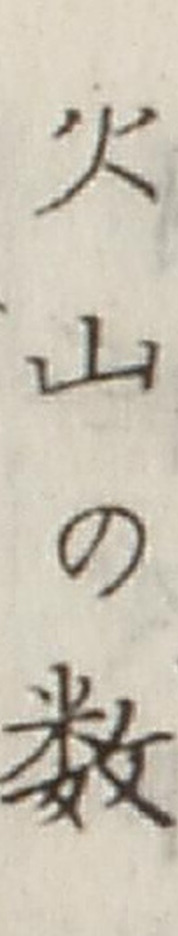火山の数
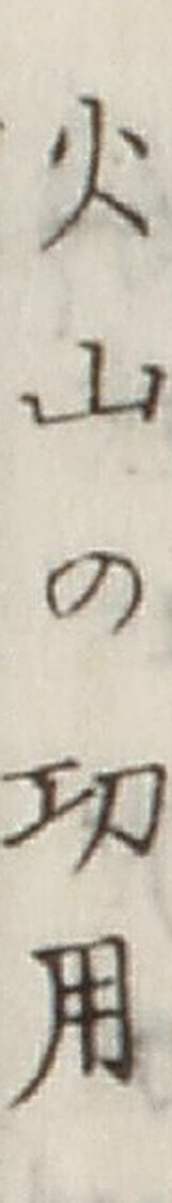火山の功用
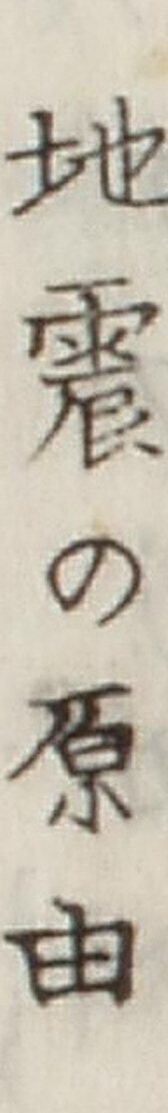地震の原由
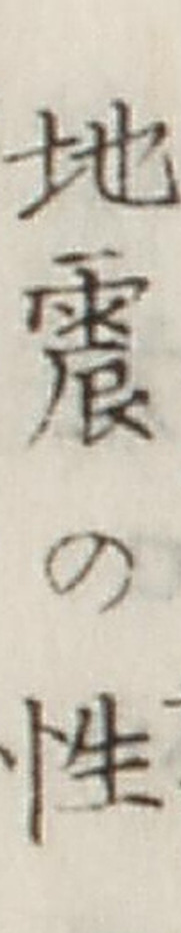地震の性
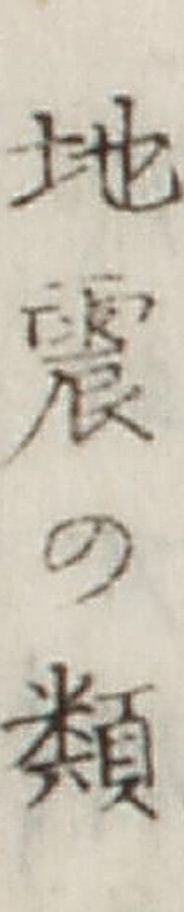地震の類
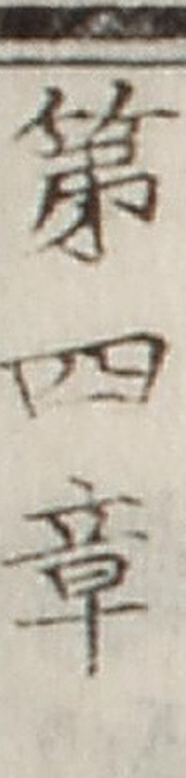第四章

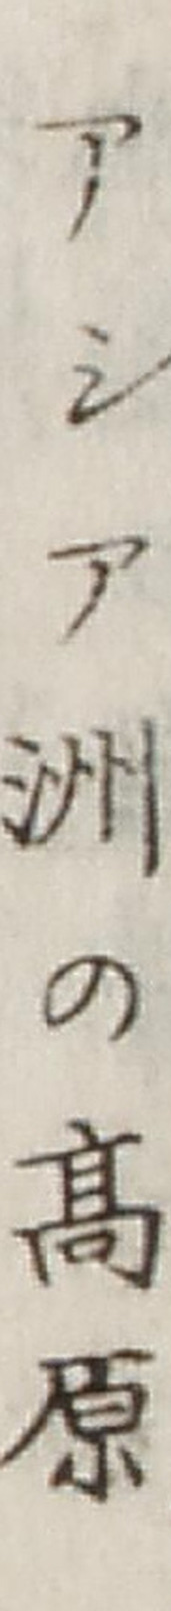アシア洲の髙原
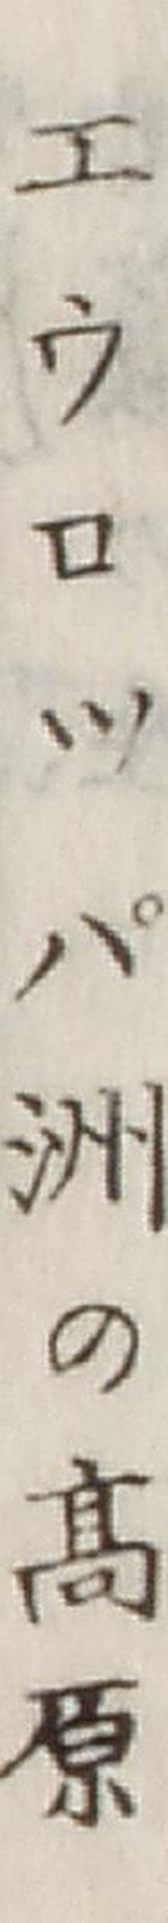エウロツパ洲の髙原
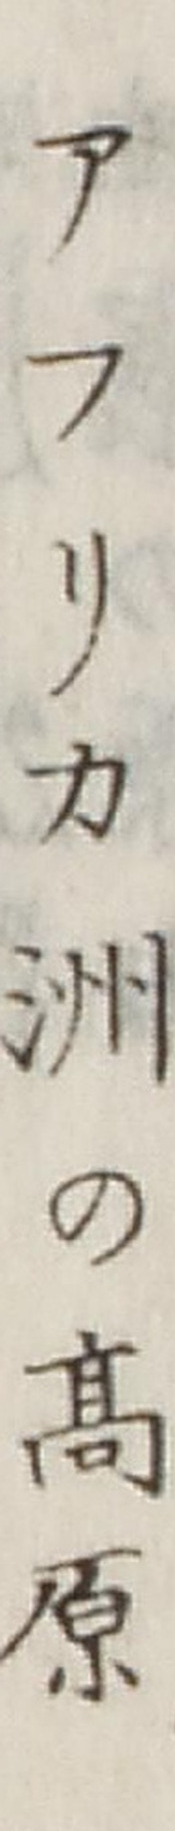アフリカ洲の髙原
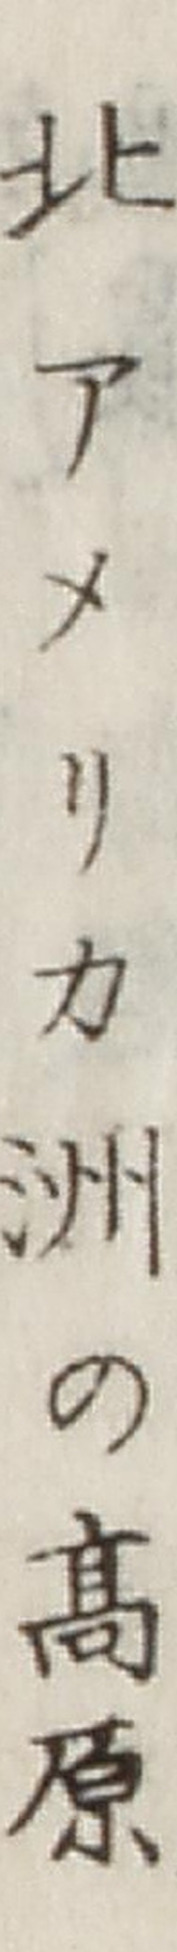北アメリカ洲の髙原
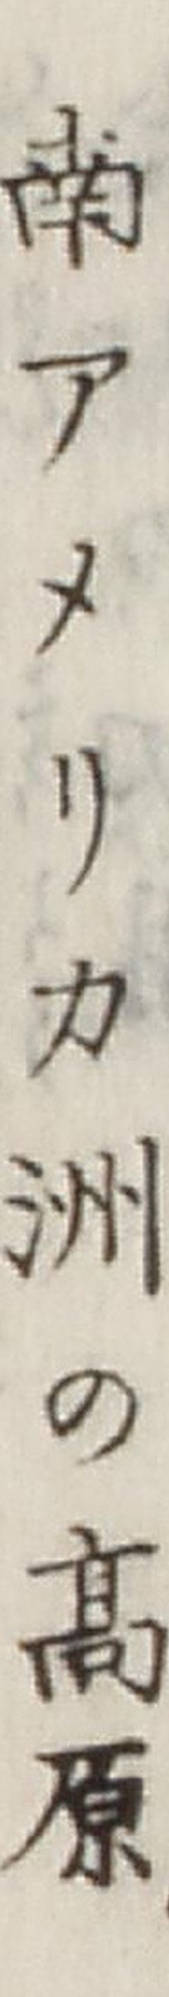南アメリカ洲の髙原
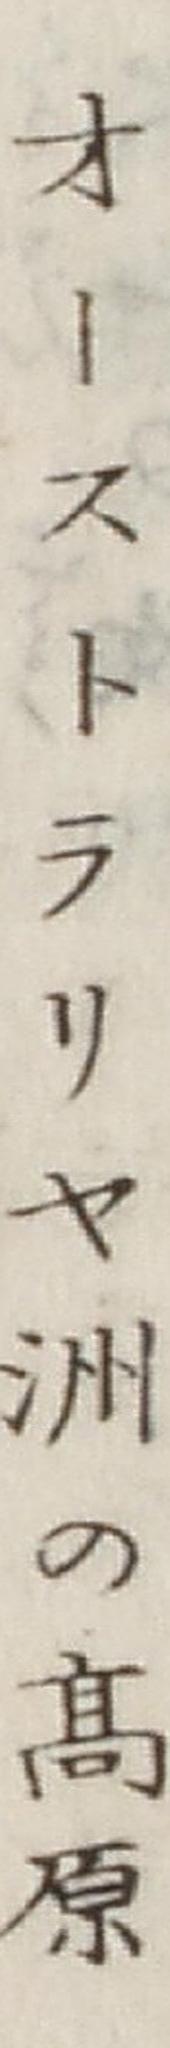オーストラリヤ洲の髙原
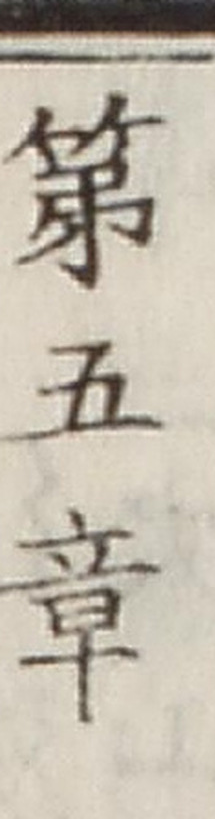第五章
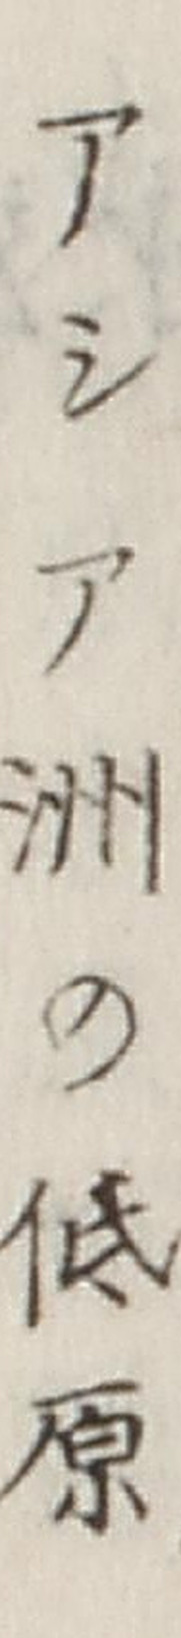アシア洲の低原
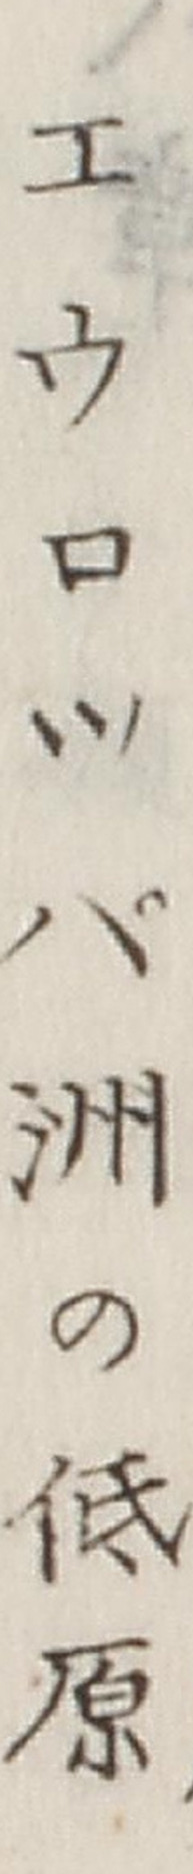エウロツパ洲の低原
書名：訓蒙　天然地理學　上
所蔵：東京大学地震研究所図書室 Earthquake Research Institute Library, The University of Tokyo, JAPAN
